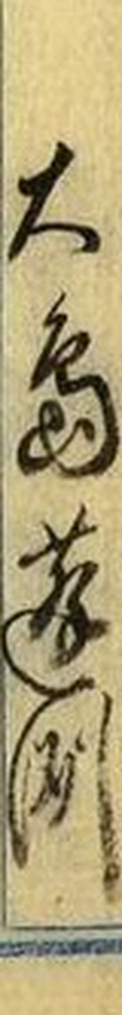大島蓬洲
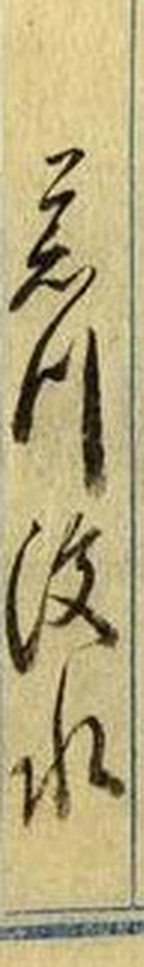荒川汶水
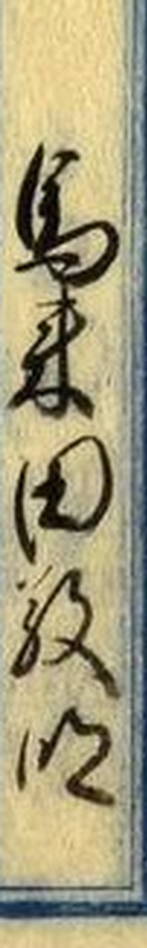馬来田敬明
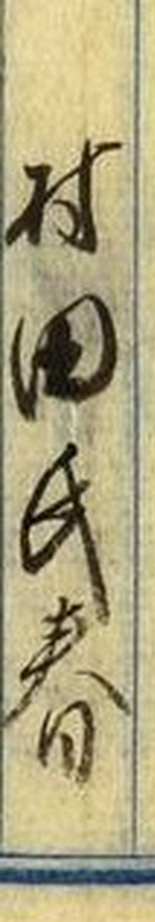村田氏春
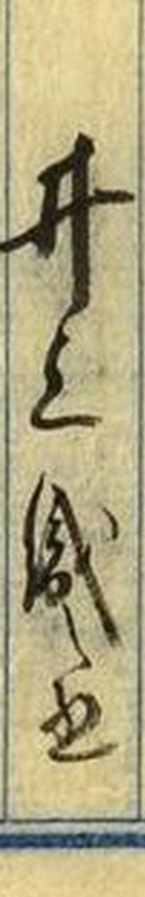井上織之丞
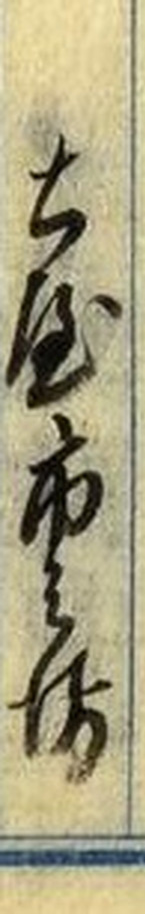土屋市兵衛

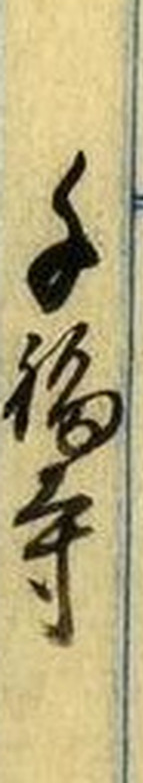千福寺
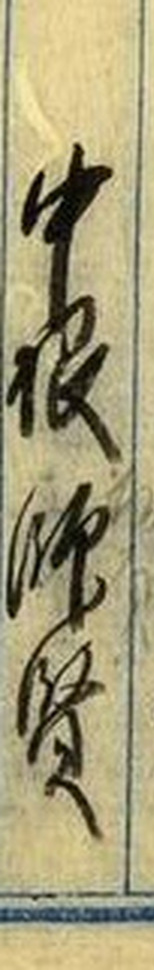中根師賢
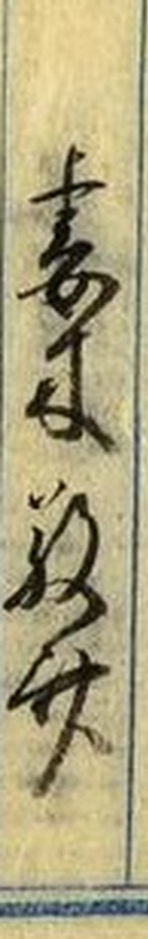妻木敬斎
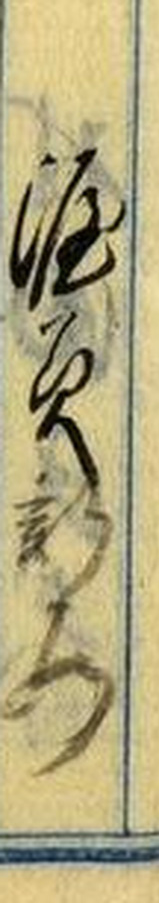渥美新右衛門
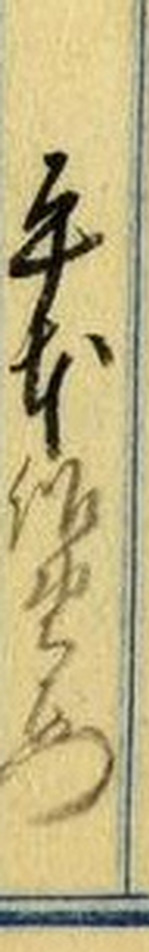平本作野右衛門
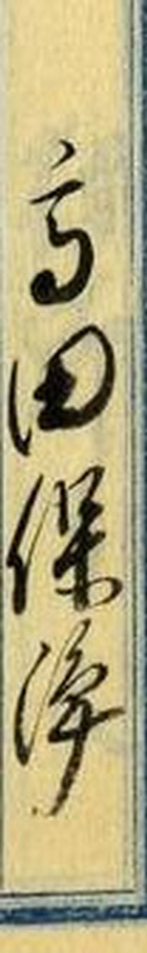高田保浄
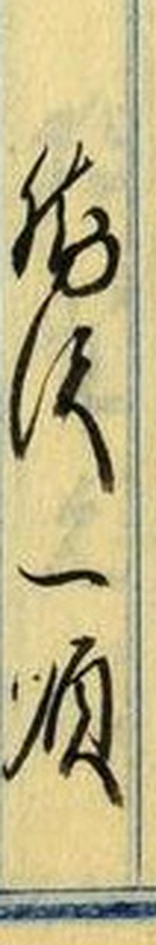勝沢一順
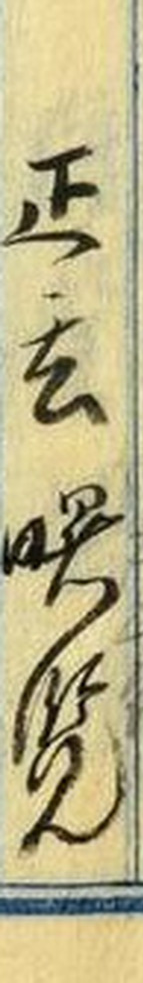正玄曙覧
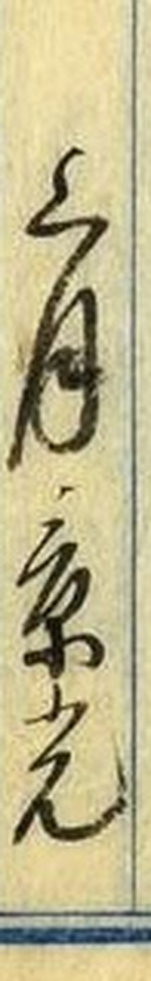上月景光

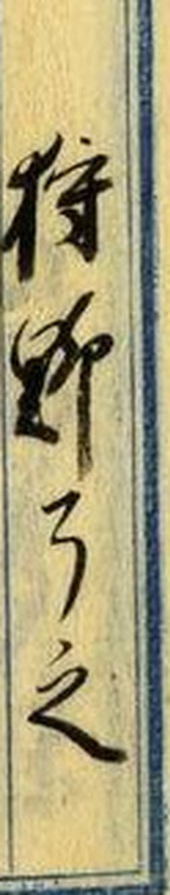狩野了之
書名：温古集 四巻
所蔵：福井県文書館 Fukui Prefectural Archives
